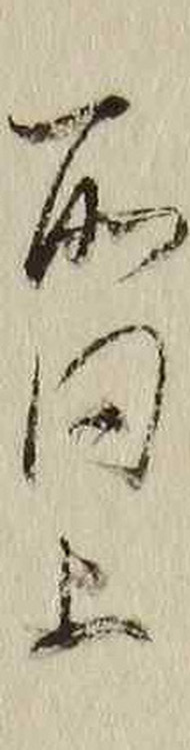所同上
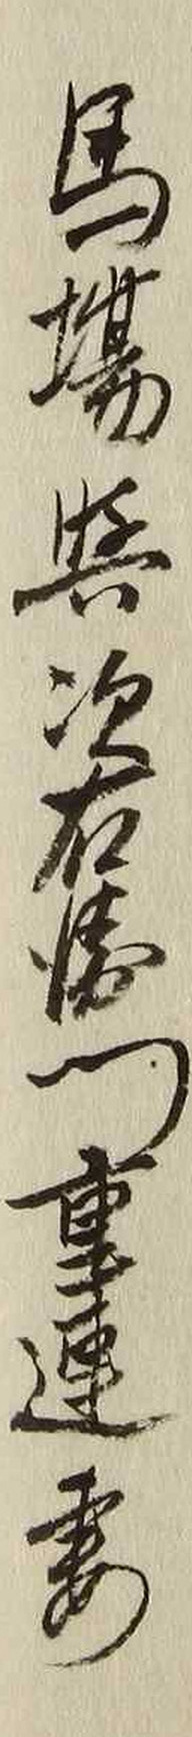女馬場与次右衛門重連妻
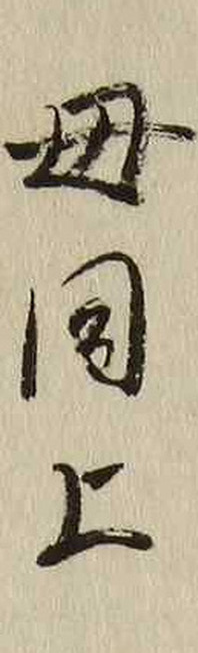母同上
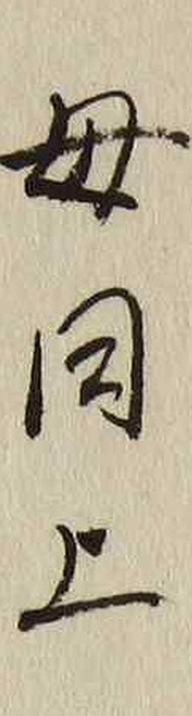母同上
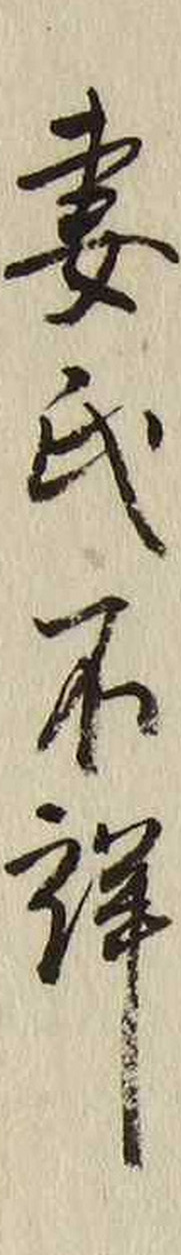妻氏不詳
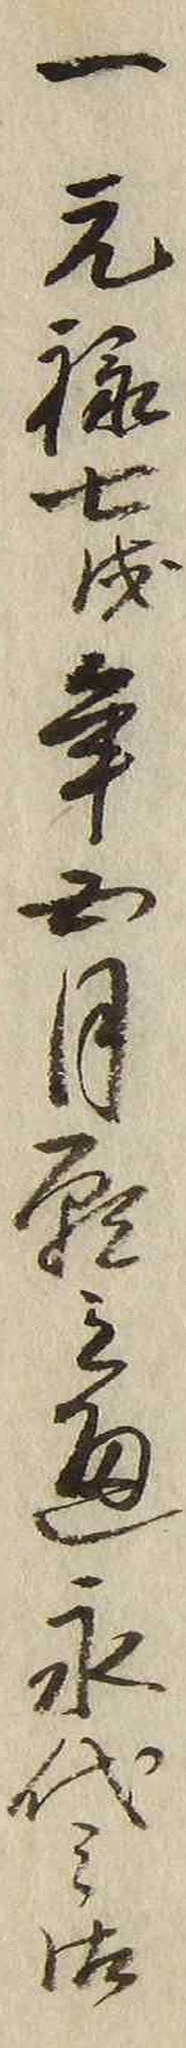一元様七戌年五月願之通永代之御

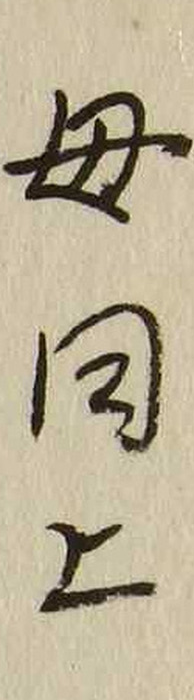母同上
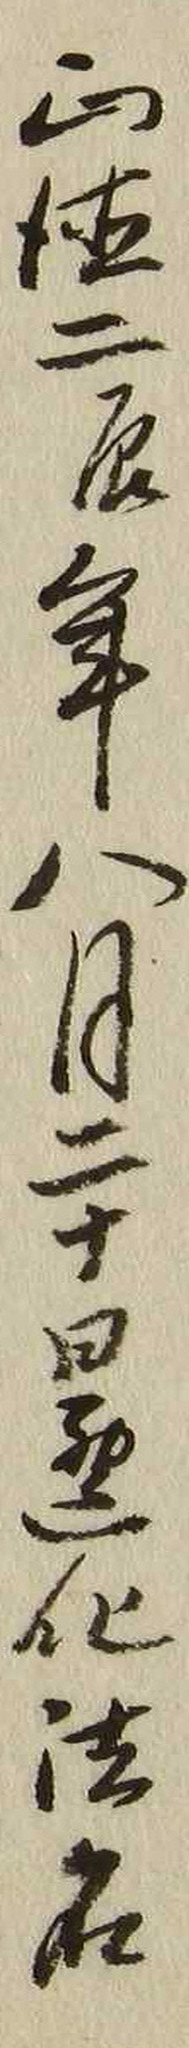正徳二辰年八月二十日遷化法名
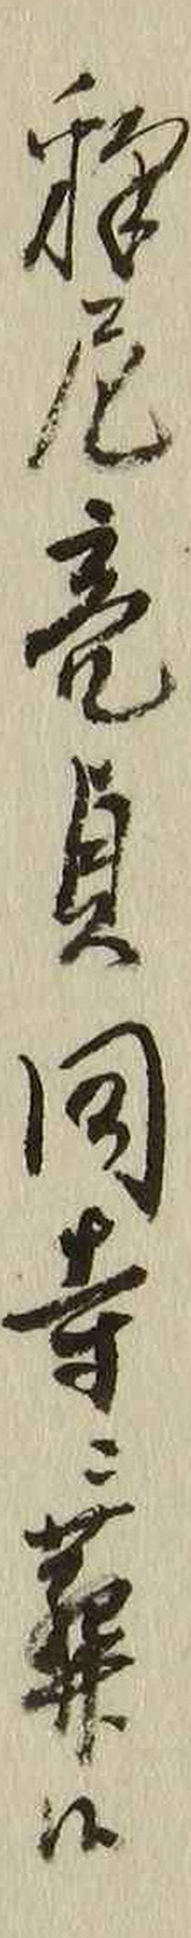釈尼亮貞同寺ニ葬候
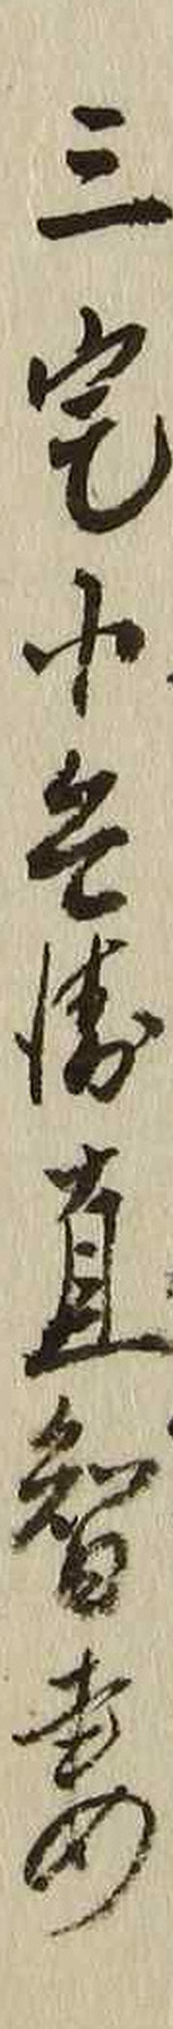三宅小兵衛直智妻
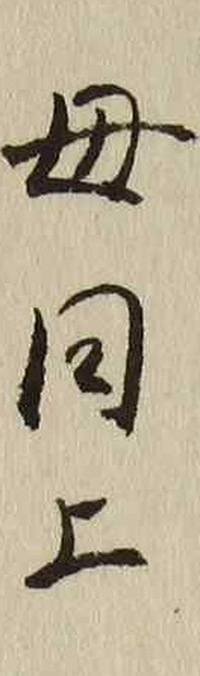母同上
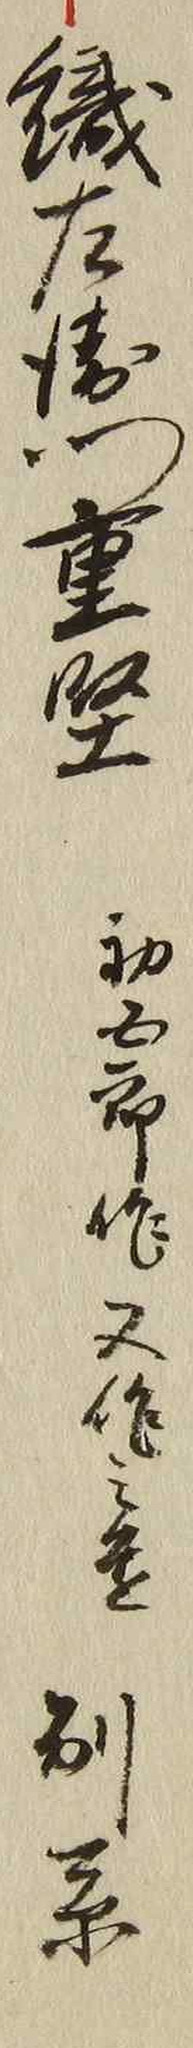織左衛門重堅初五郎作又作之進別系
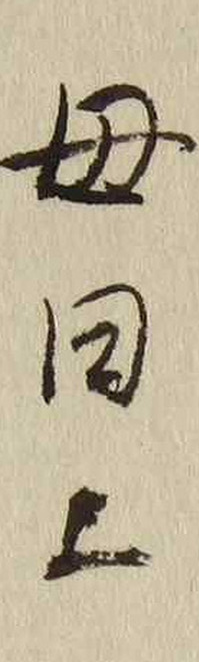母同上
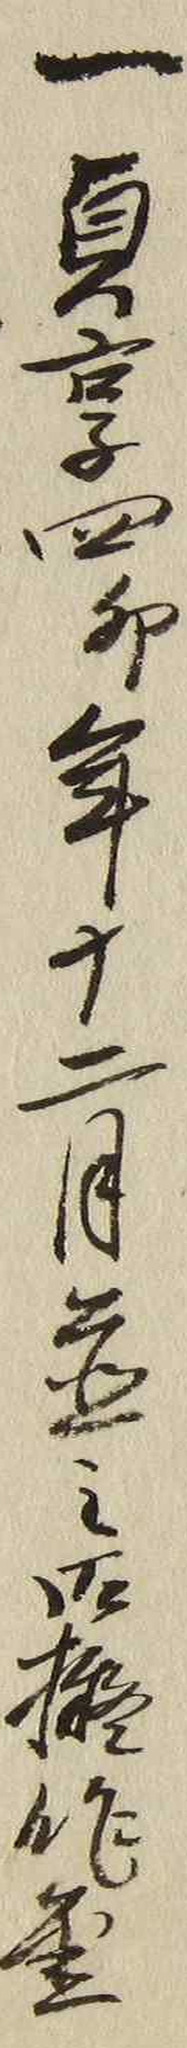一貞享四卯年十二月並之御擬作金
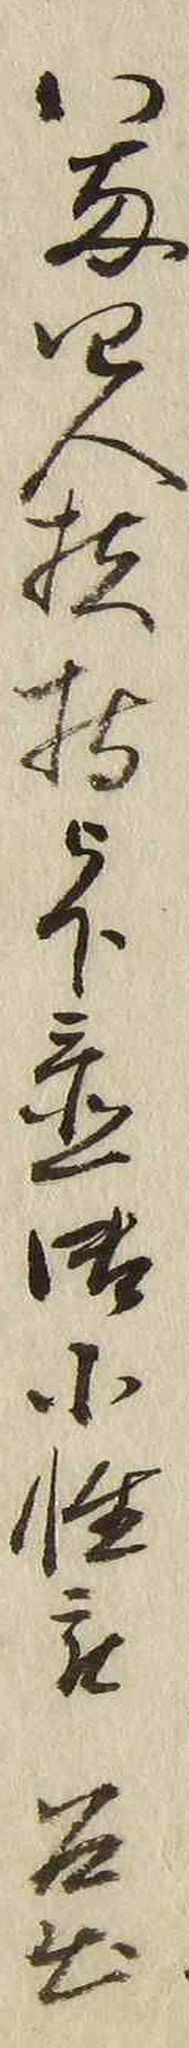八両四人扶持被下置御小性被召出

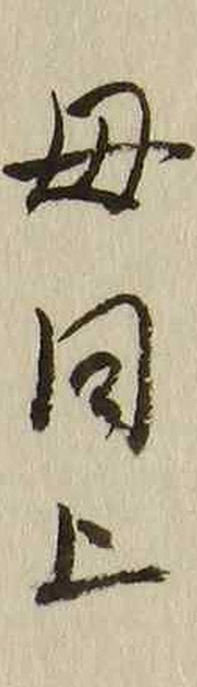母同上
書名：諸士系譜　巻之356　す之部6
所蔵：会津若松市立会津図書館
